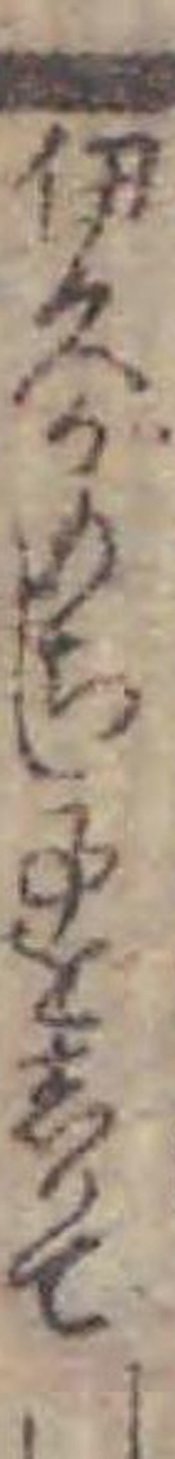伊久がもちし事をしりて
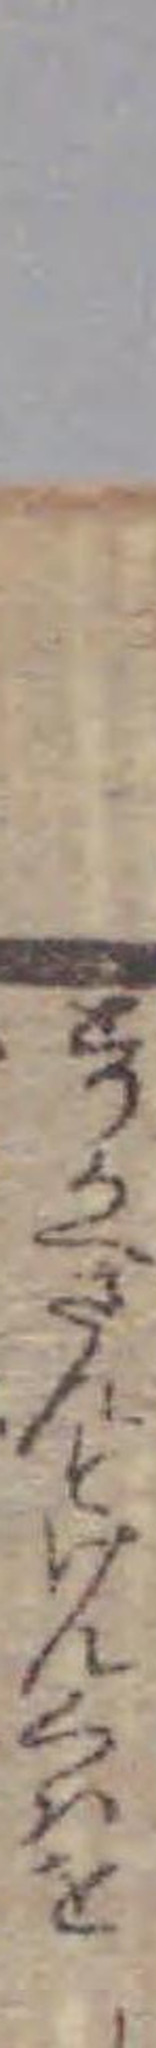とりかへさんとけんくはを
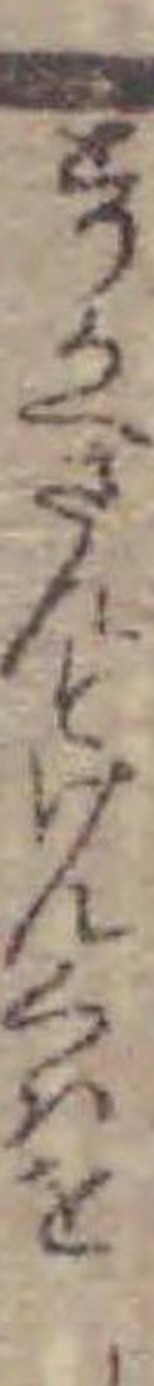とりかへさんとけんくはを
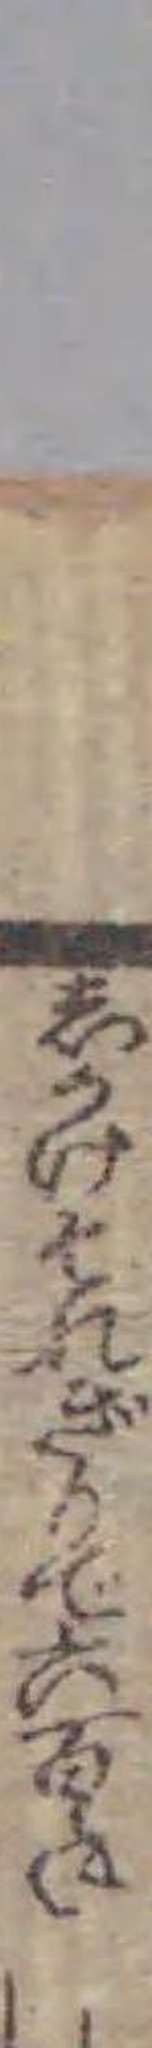しかけそれぎりで六百年
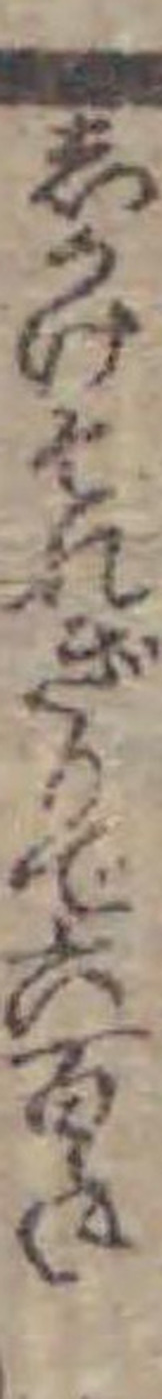しかけそれぎりで六百年
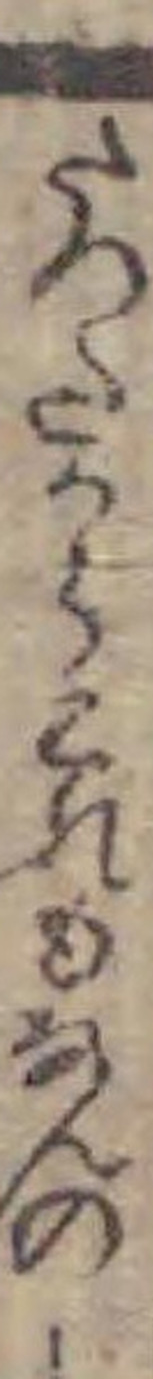たつたからこれもなんの
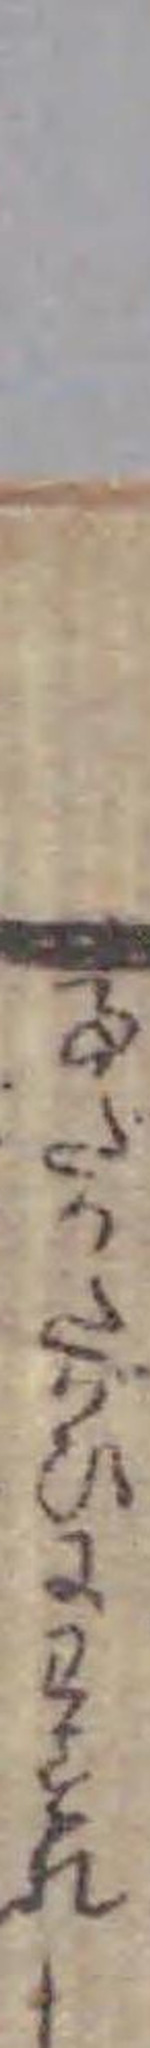事だかたがひにわすれ
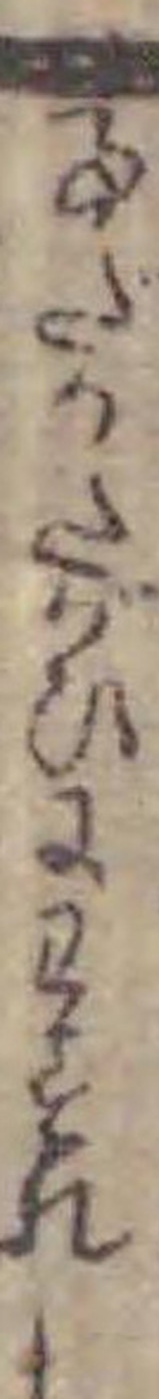事だかたがひにわすれ
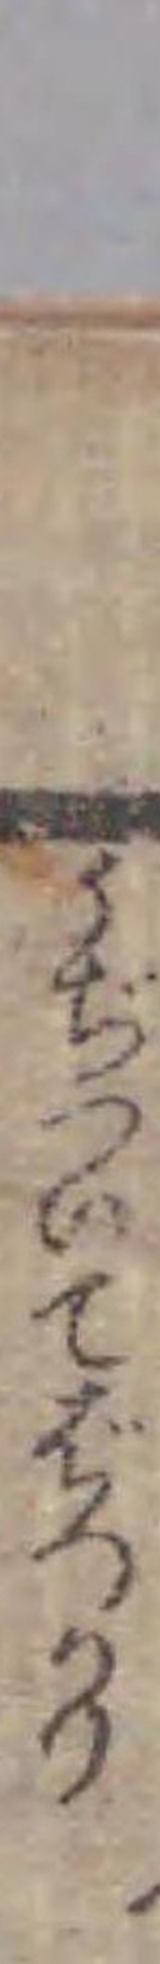うぢついてばつかり
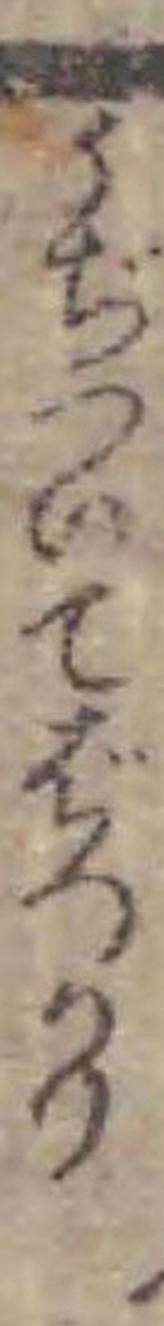うぢついてばつかり
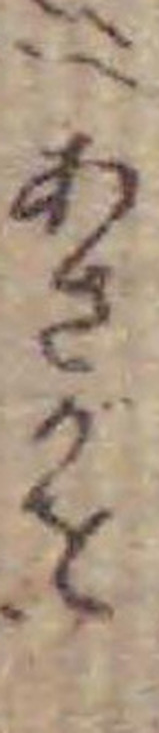あさがを
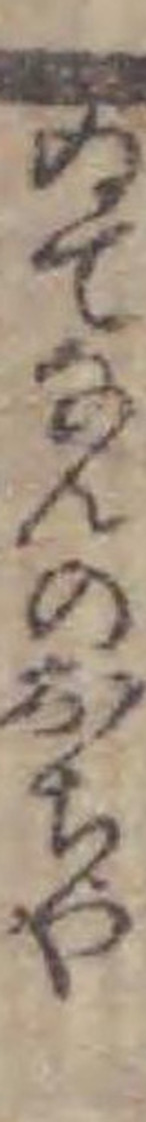ゐてなんのおちや
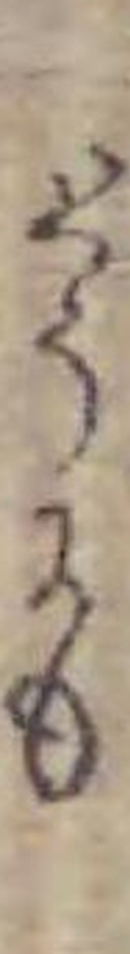とうにも
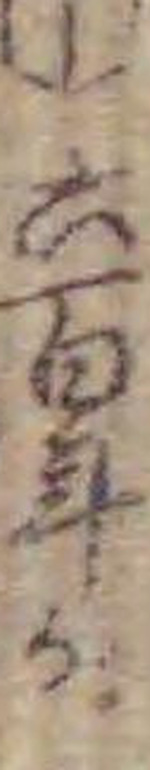六百年が
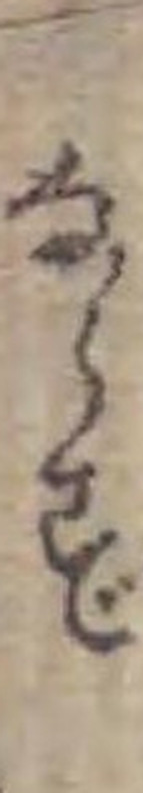ならず
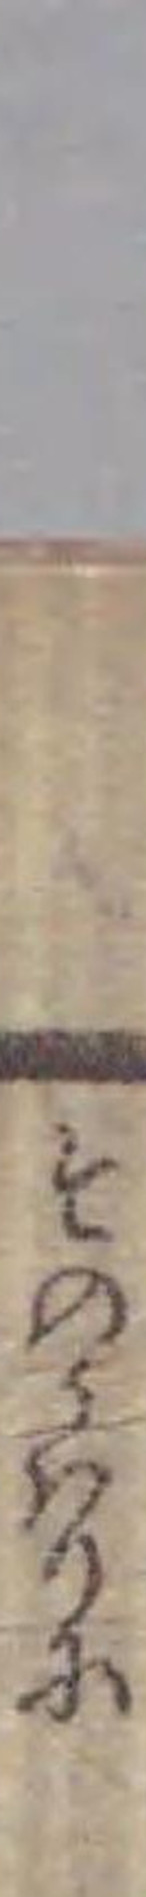そのかはりに
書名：年寄之冷水曽我 : 3巻
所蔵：国立国会図書館 National Diet Library, JAPAN
